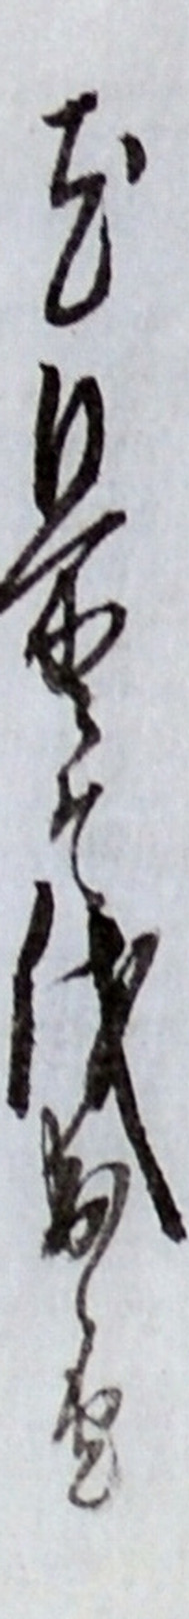尤自所ニて伐出候由

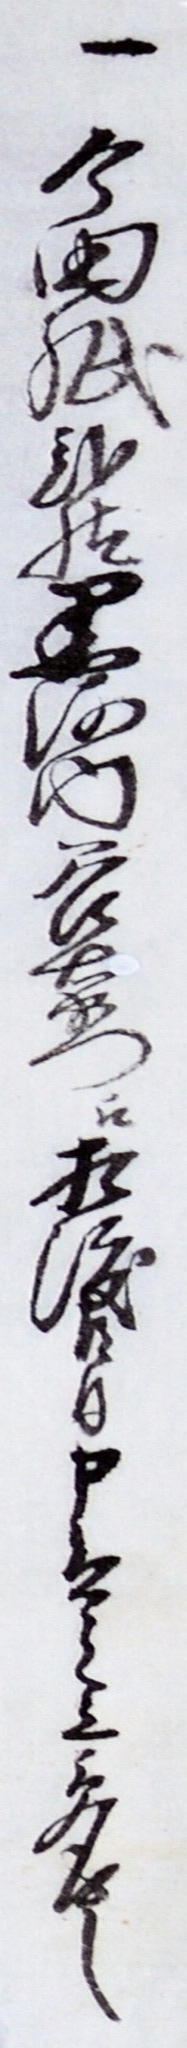一今田紙弐駄黒河内善右衛門江相渡候旨申有之上谷中
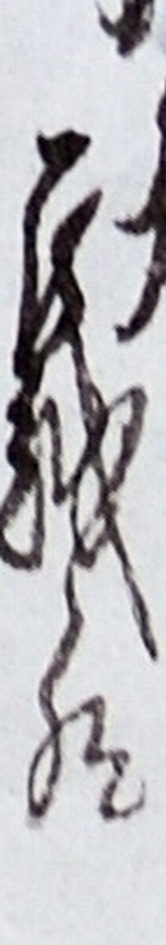罷越候様
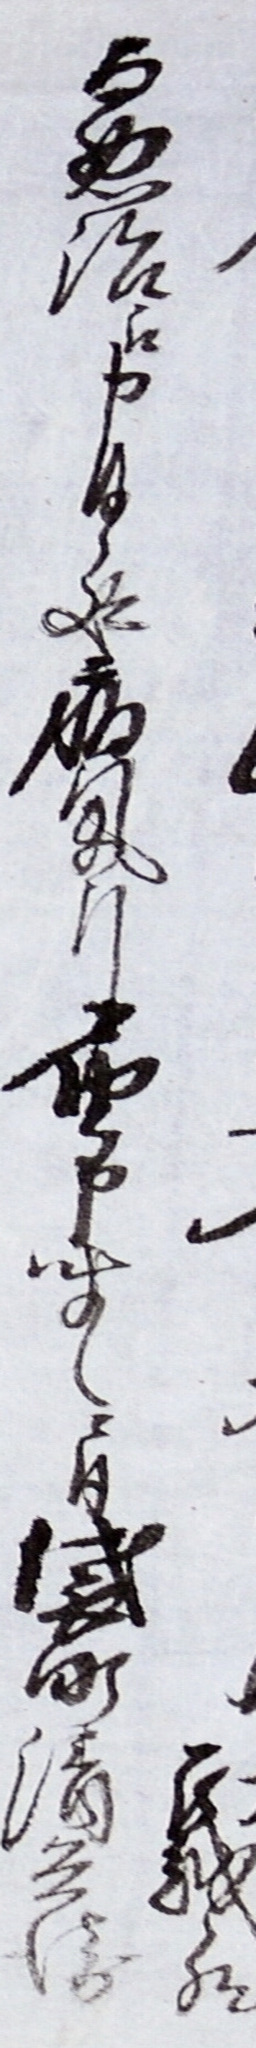与惣治江申付候処病気引届申聞候ニ付袋町清兵衛
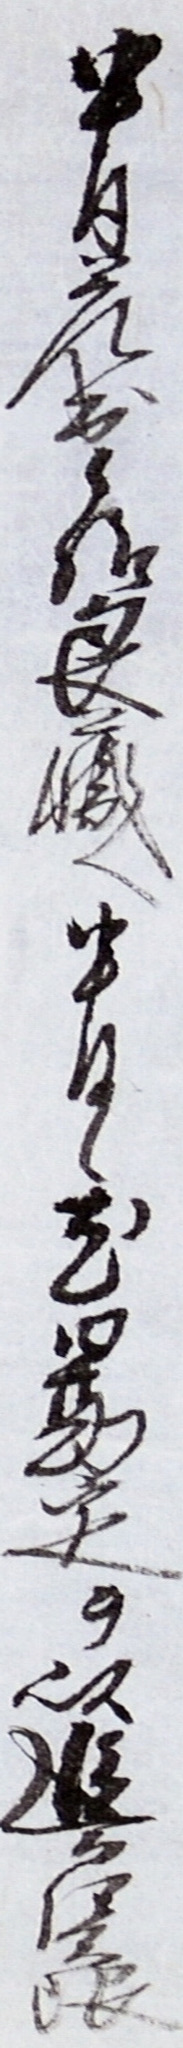中月差出候様良蔵へ申付候尤日勘定ヲ以追而仕賃銀
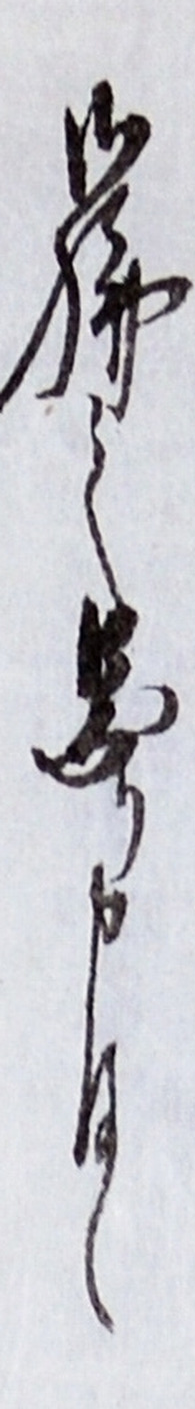御払之図り申付候
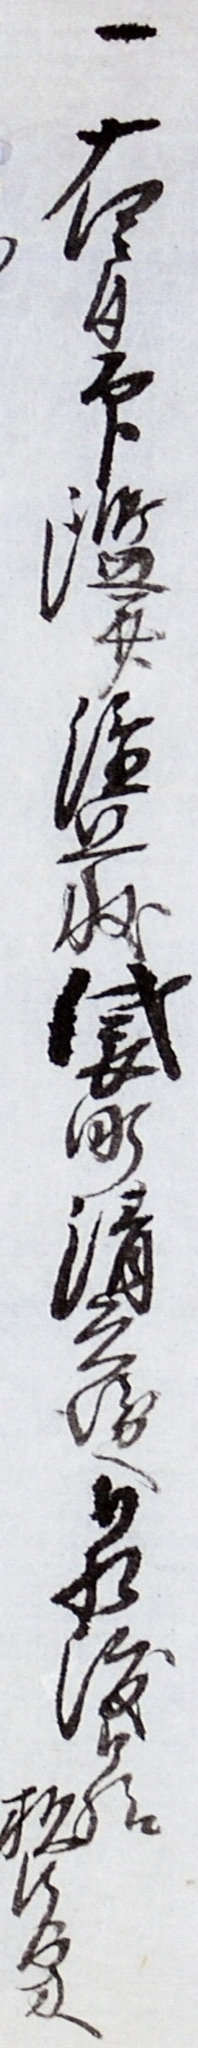一右ニ付印鑑并添廻状袋町清兵衛へ被相渡候様
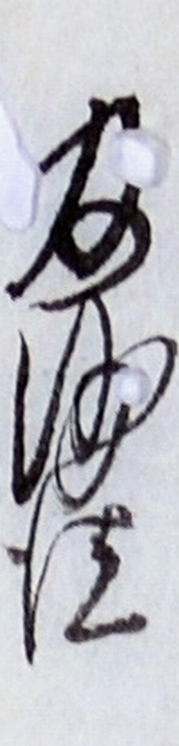及沙汰
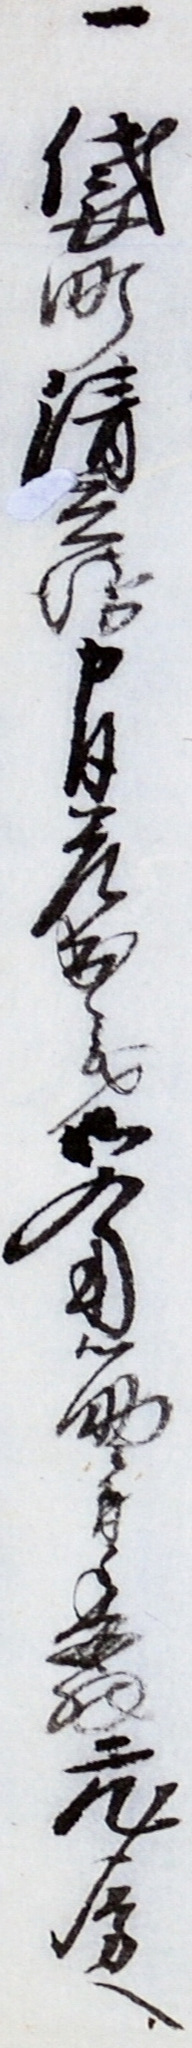一袋町清兵衛申付差出之義御入用筋ニ付委細元メ方へ
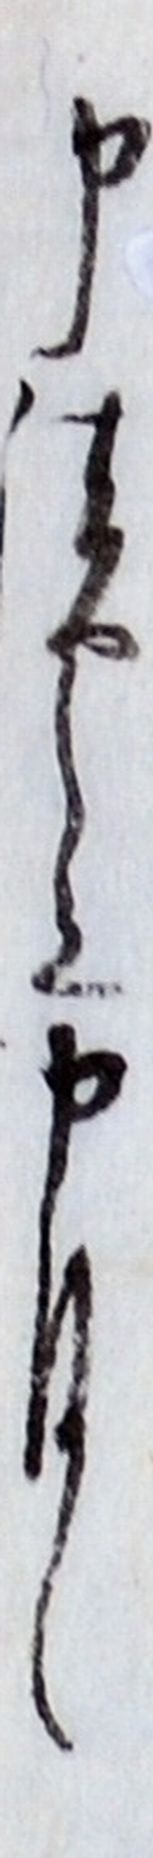申談之上申付候
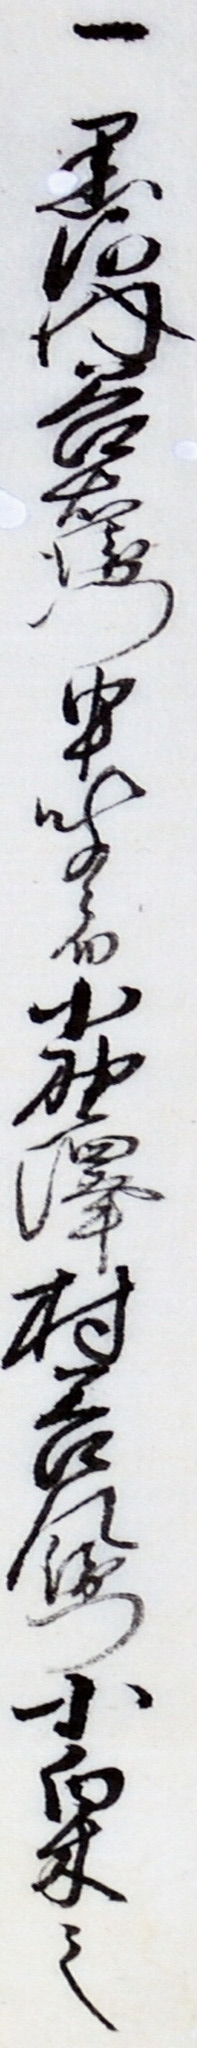一黒河内善右衛門申聞届小野澤村善左衛門小白木之
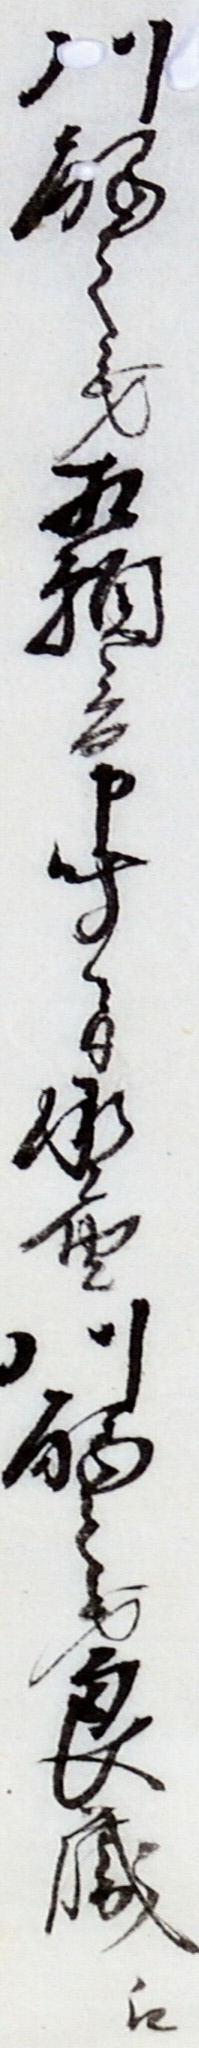川触之義相願之旨申聞候付承届川触之義良蔵江
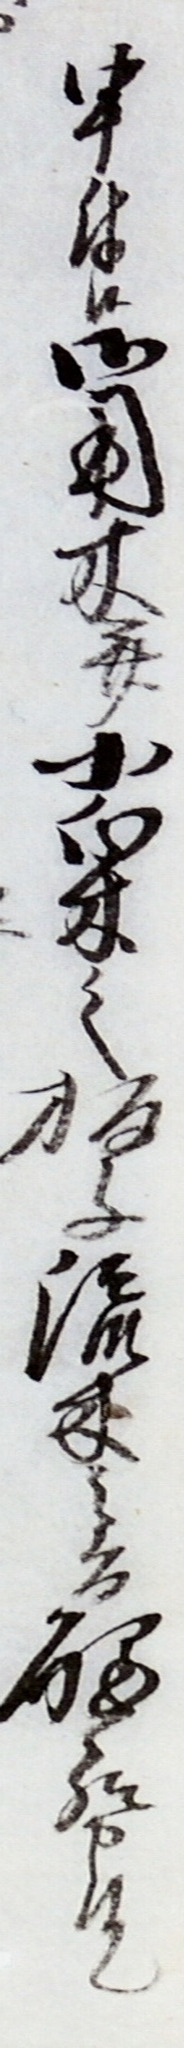申付候御用木并小白木之板子流木之旨触候様申付候
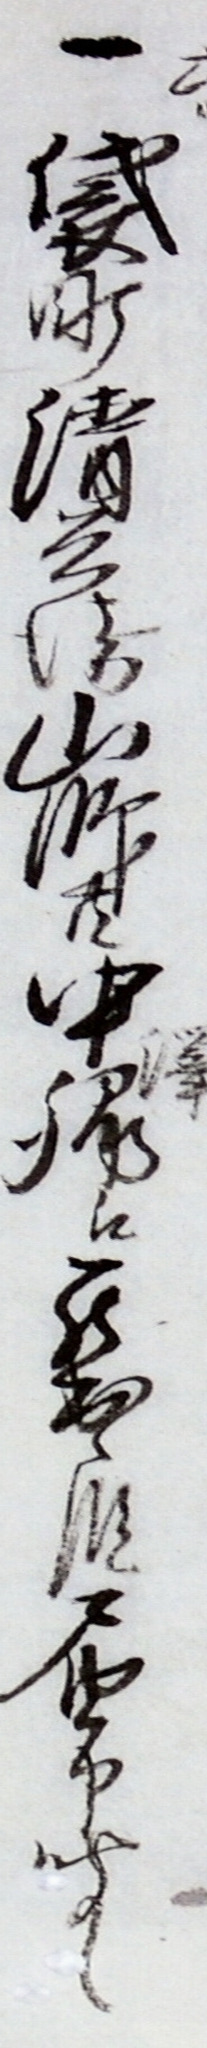一袋町清兵衛山師共中沢郷江罷出候段届申聞候
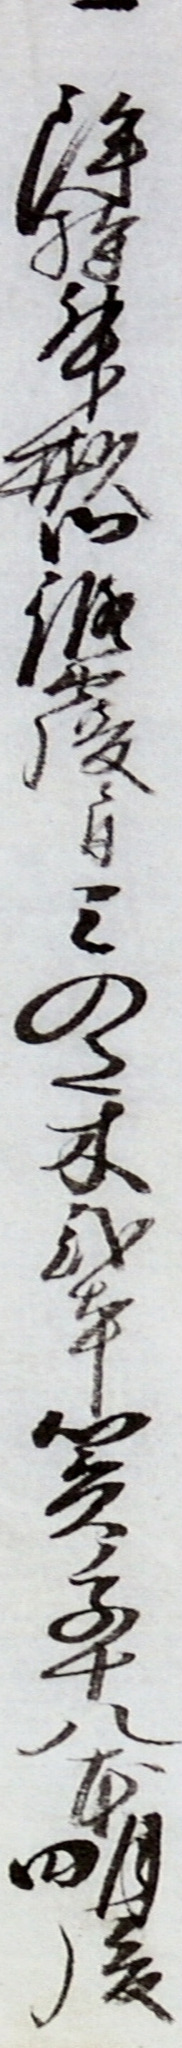一鉾持升形御修覆ニ付主のた木弐本簀ノ子十八本明後
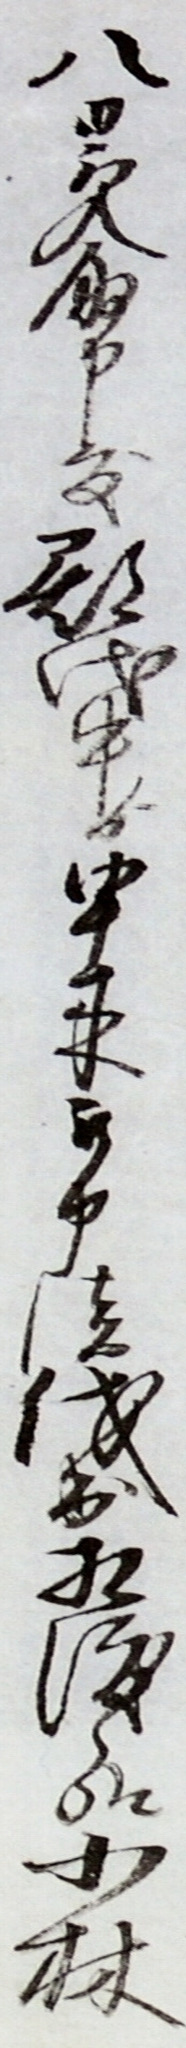八日受取申度郡代中ゟ申来被申談伐出相渡様小林
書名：御山奉行御用控
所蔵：伊那市立高遠町図書館・合同会社AMANE
